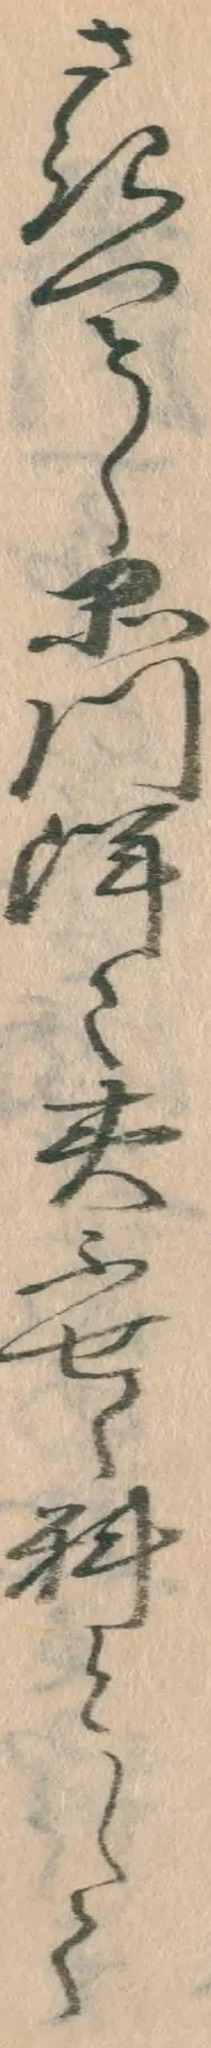さきつとし品川洋に夷ふせく料として
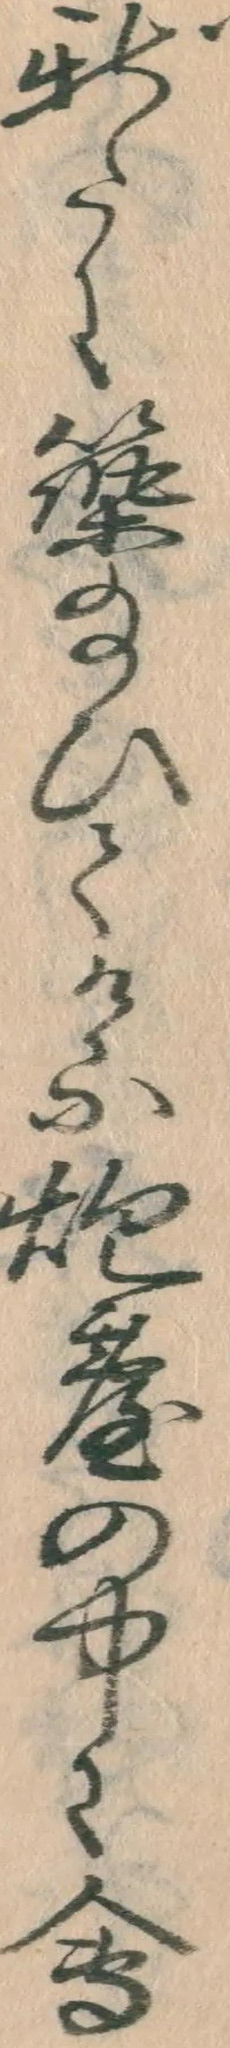新たに築玉ひてける砲臺の中に會
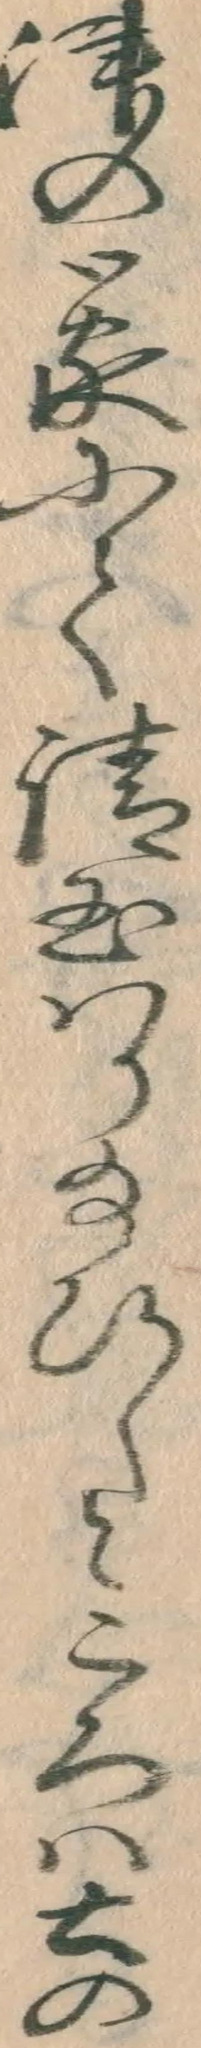津の御家にて請玉ハり玉ひしてころハ土の
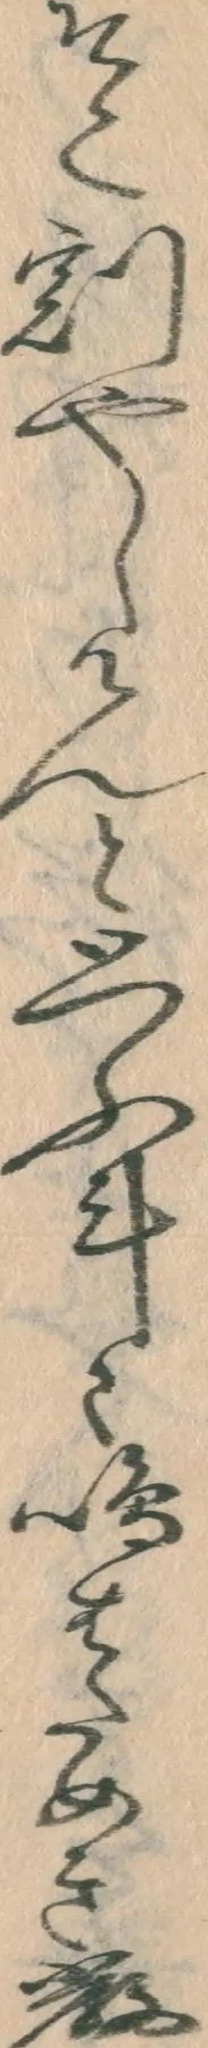そこ割やしけんと思ふ斗ニ鳴はためき厳
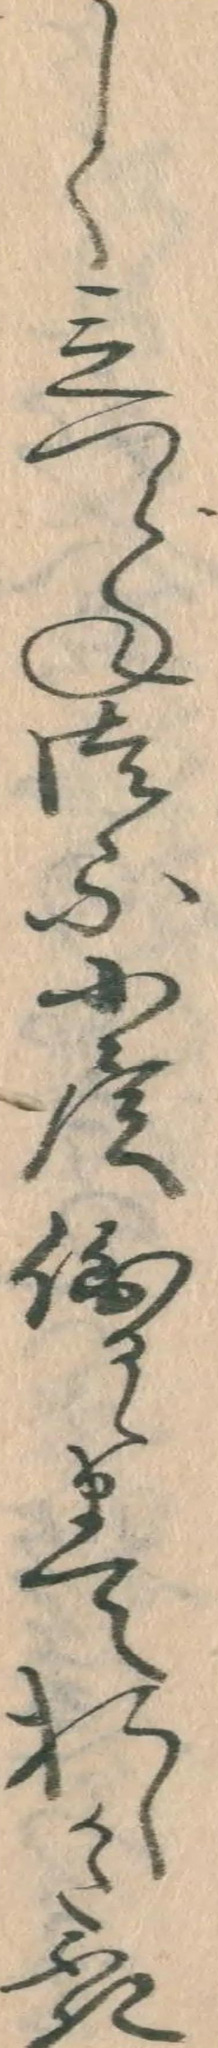しく立つらねつる小屋倒るヽまておしかたふき
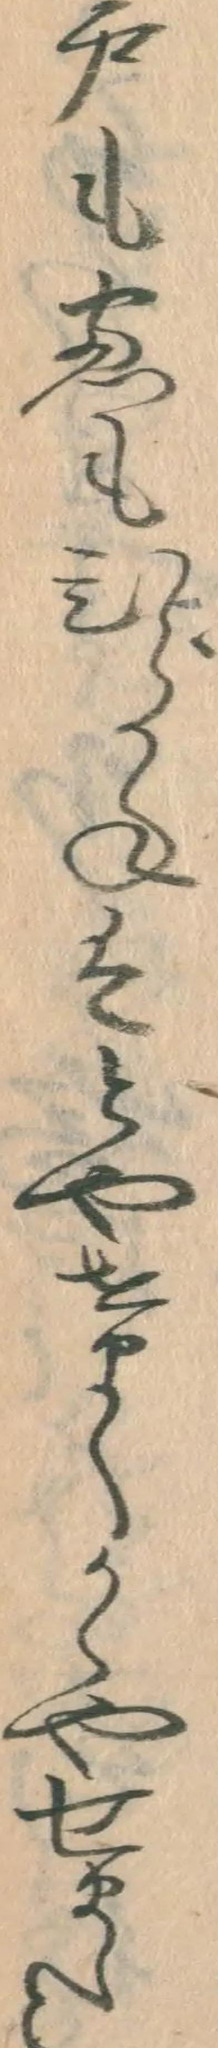戸も窓もひらかねはとやせましからやせましと

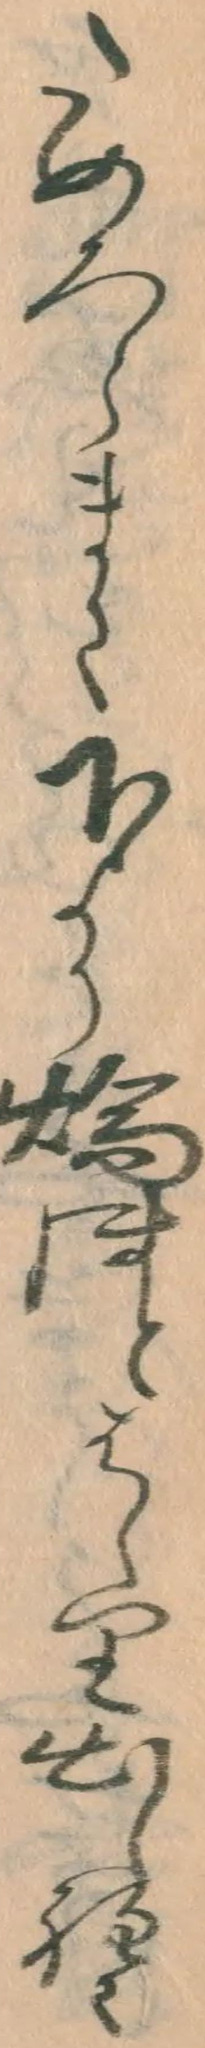ためかつしまに下より焰ほとはしり出し程に
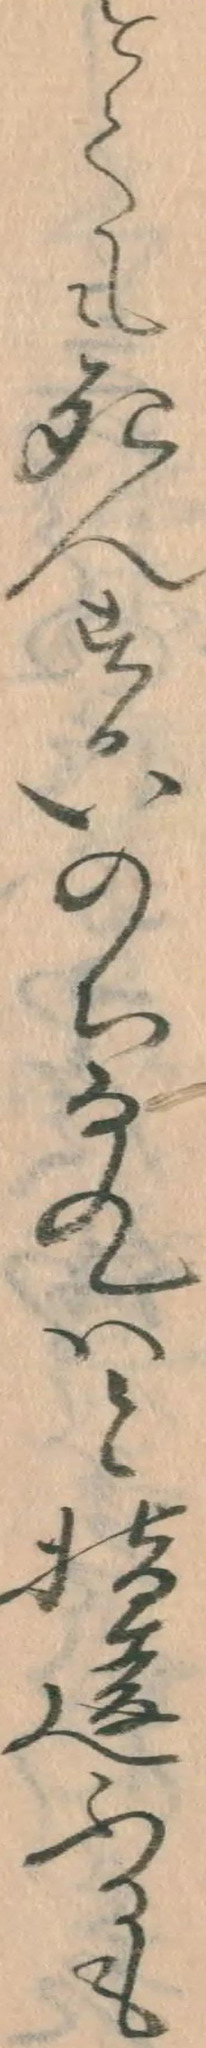とても死んするいのちなれハと指違ふるも
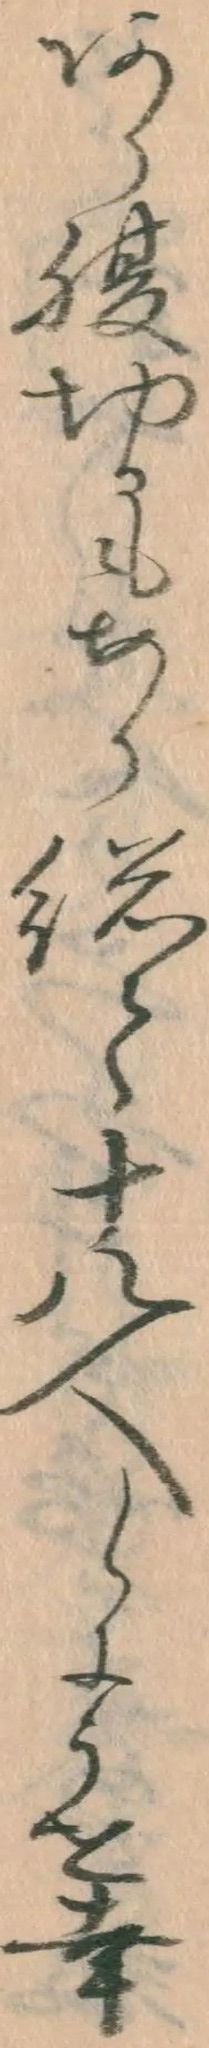あり腹切るもあり総て十八人しにうせ幸
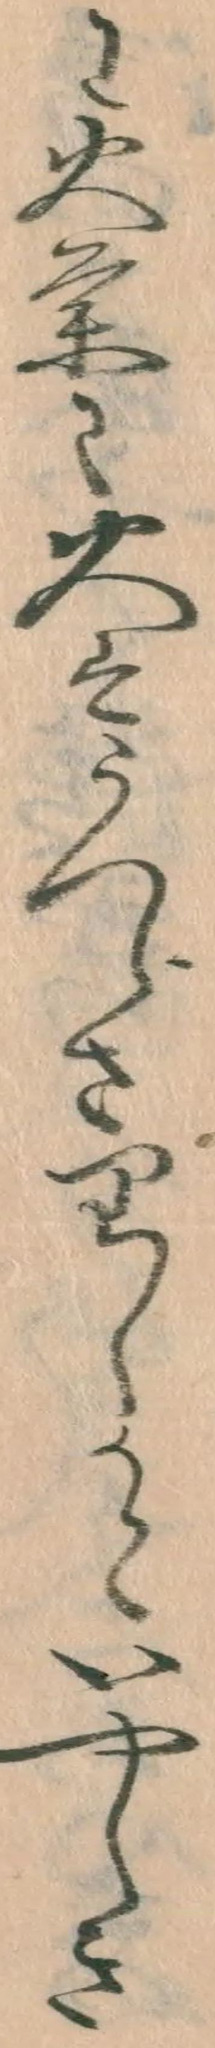に火薬に火はうつらさりしかと御やしき
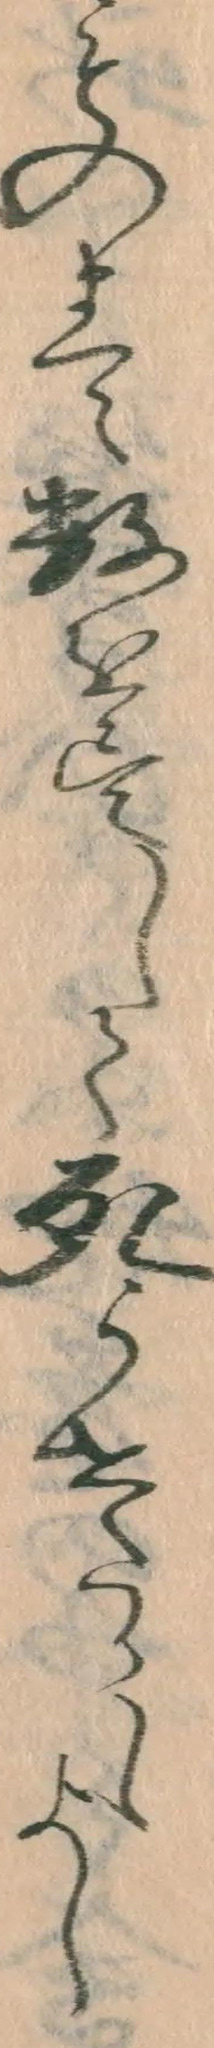ものまて数を尽して死うせたりしよし
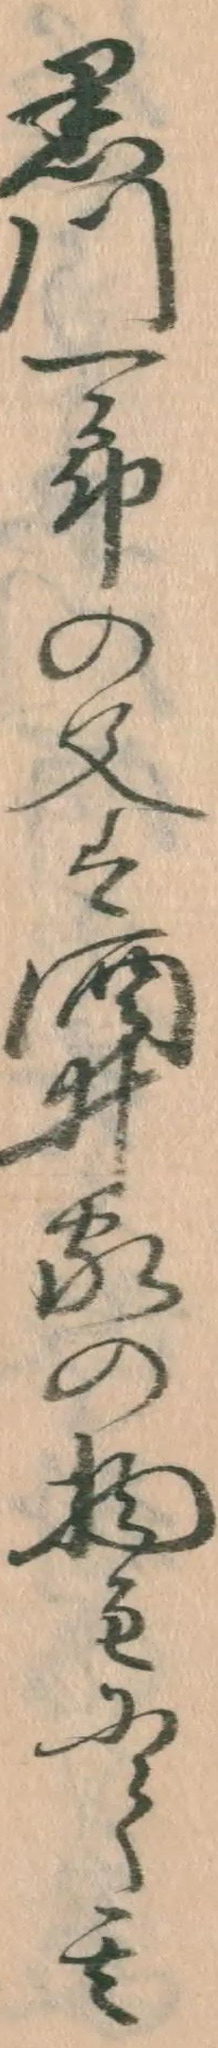黒川一郎の父は酒井家の物主にて其
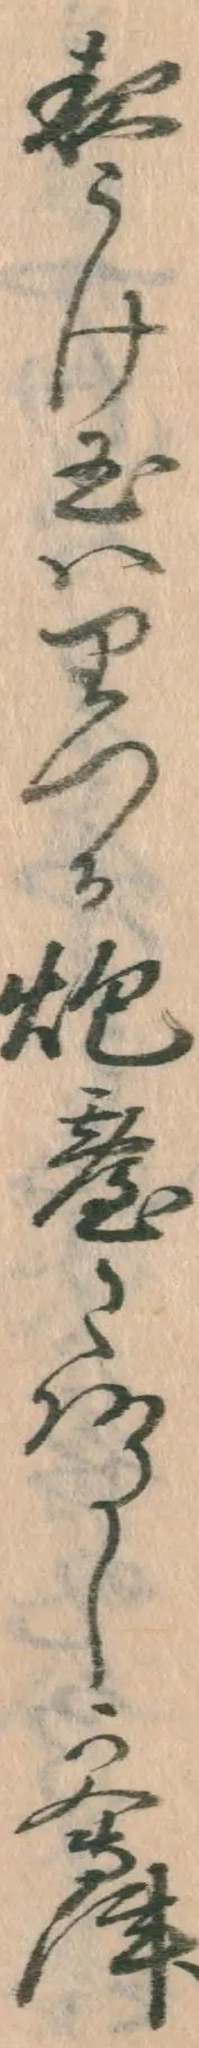夜うけ玉ハりつる砲臺にありしか會津
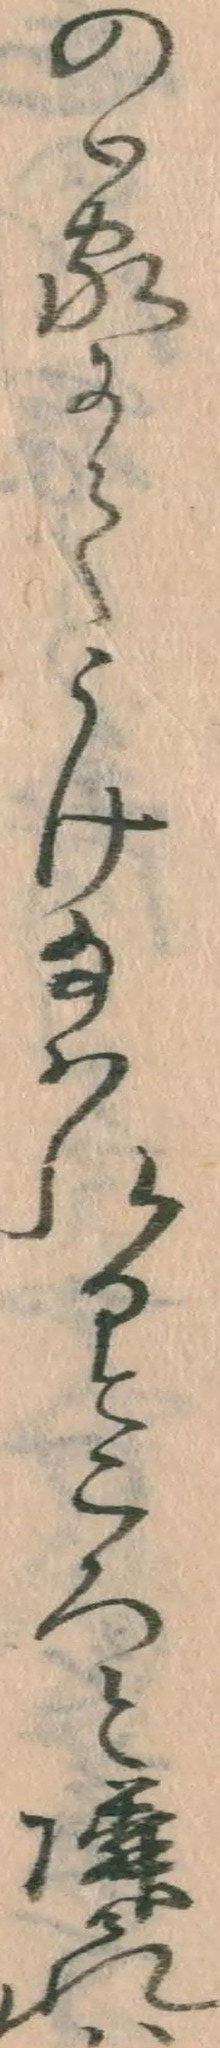の御家にてうけ玉ハれるところと隣けれハ
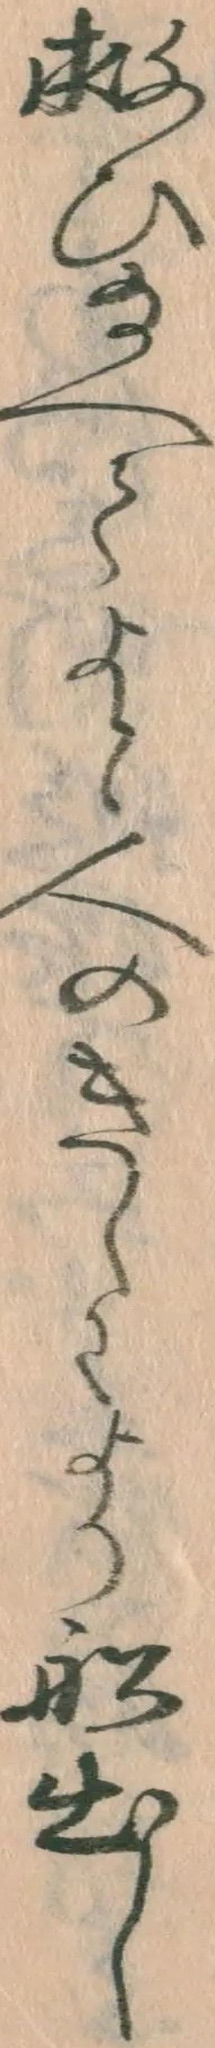救ひ玉へてよと人のきくにより船出し
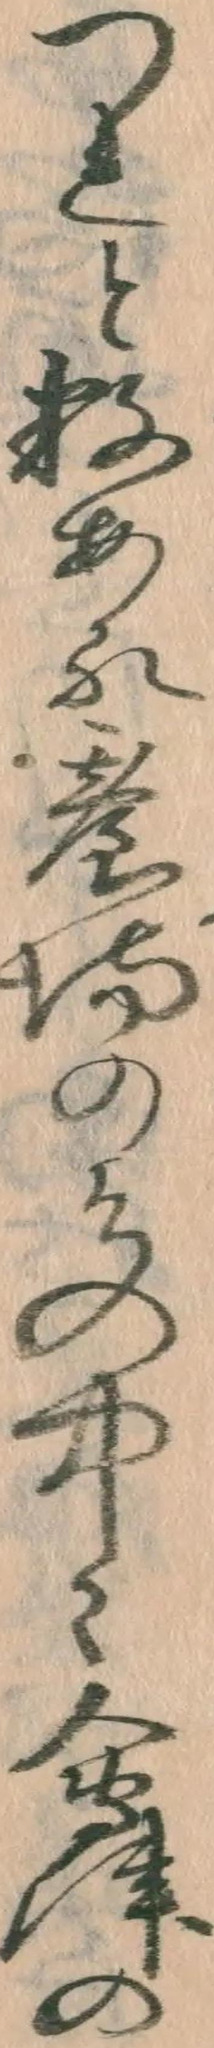つれと数ある臺場のその中に會津の
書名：麗斎叢書. 20
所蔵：国立国会図書館 National Diet Library, JAPAN
